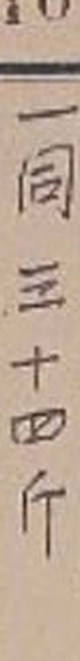一同三十四斤
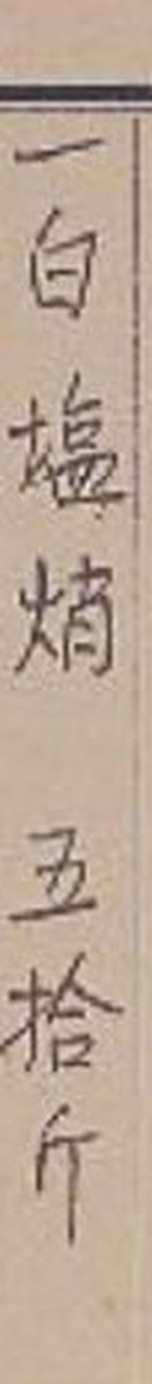一白塩硝五拾斤
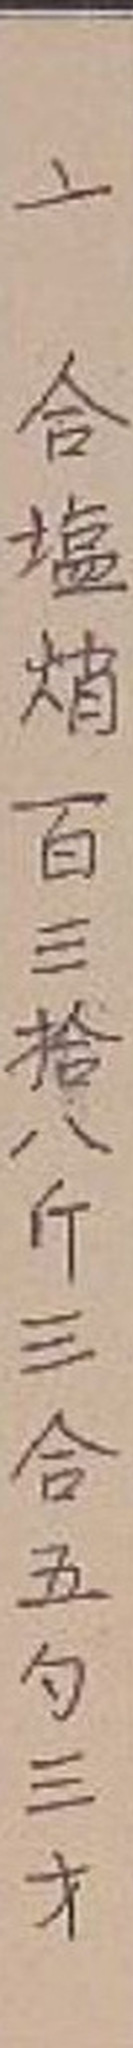〆合塩硝百三拾八斤三合五勺三才

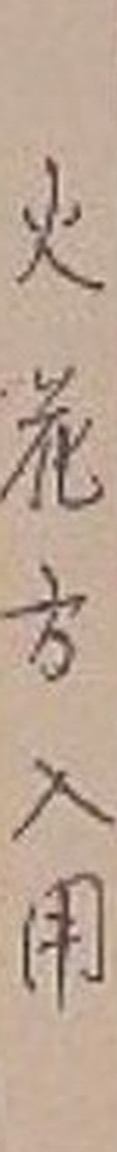火花方入用
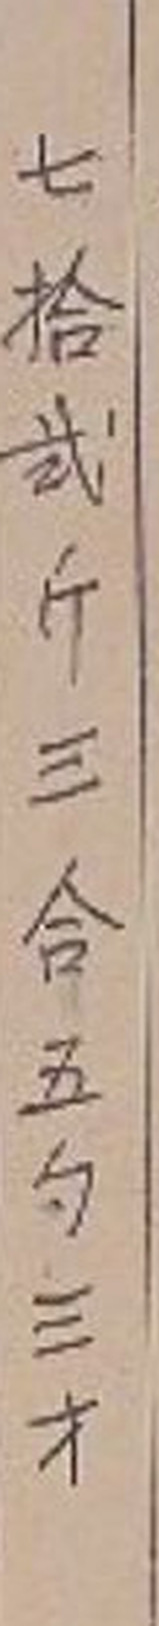七拾弐斤三合五勺三才
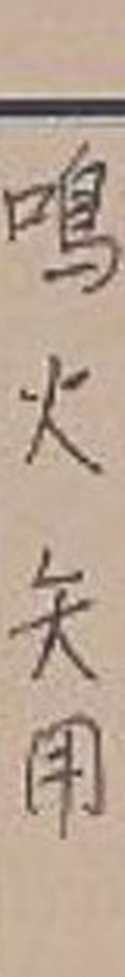鳴火矢用
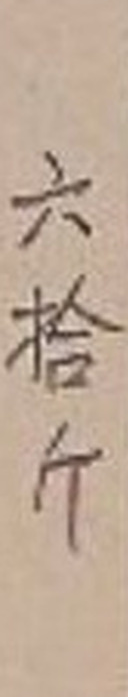六拾斤
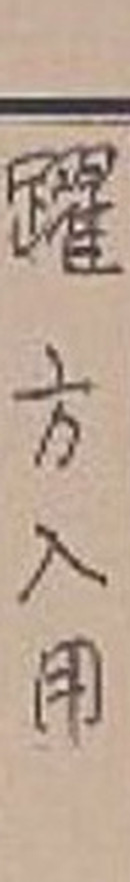躍方入用
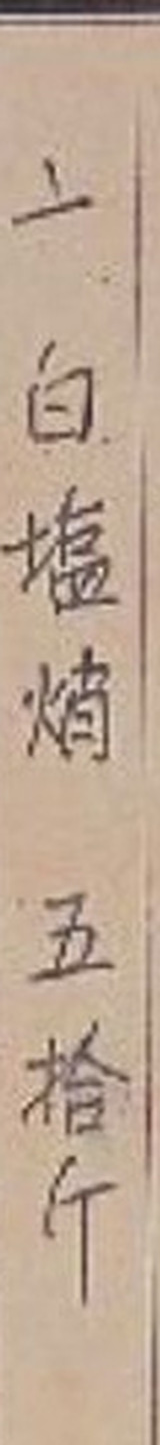〆白塩硝五拾斤
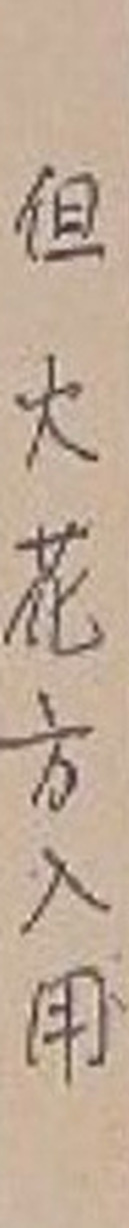但火花方入用
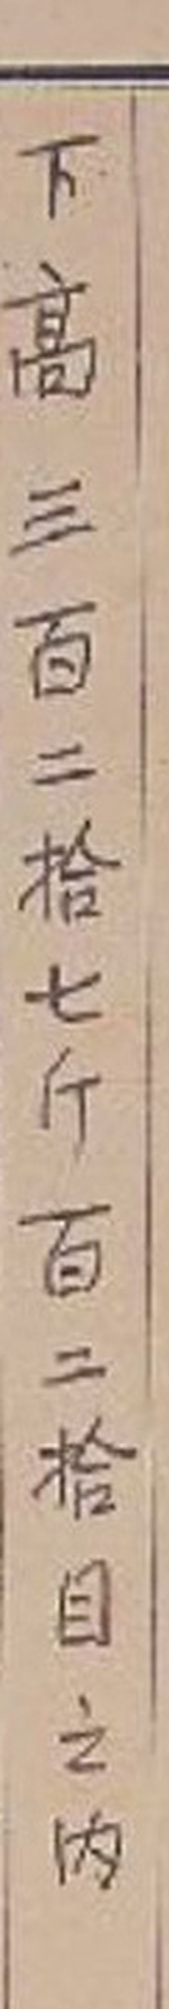下高三百二拾七斤百二拾目之内
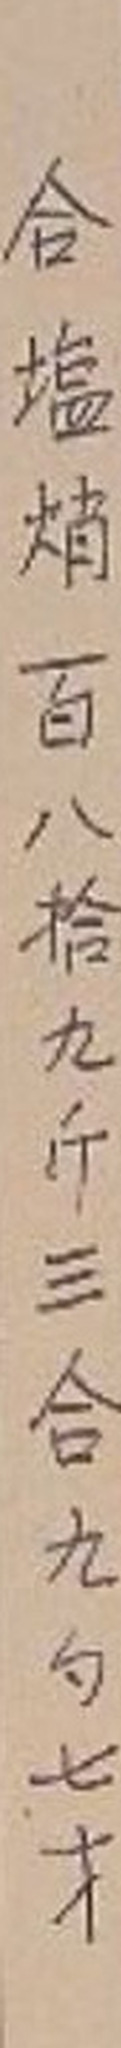合塩硝百八拾九斤三合九勺七才
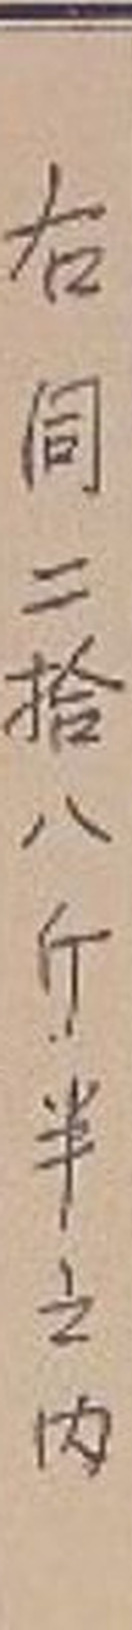右同二拾八斤半之内
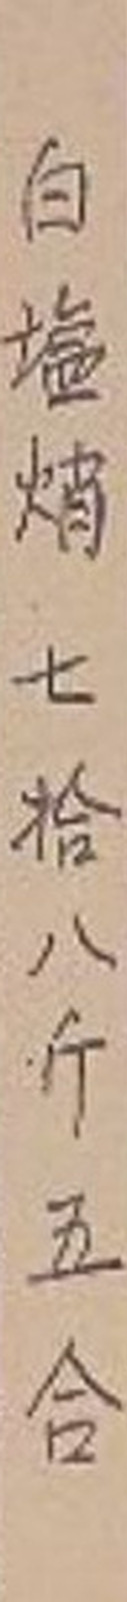白塩硝七拾八斤五合
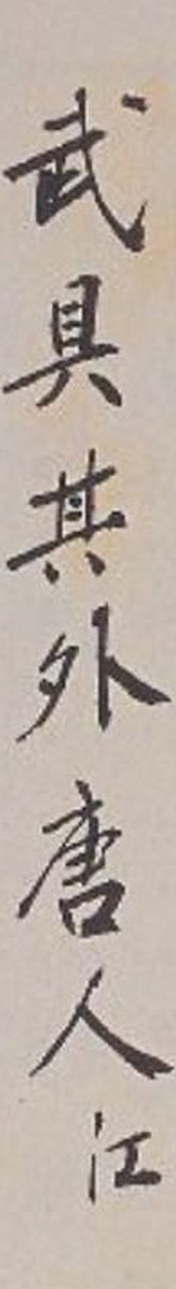武具其外唐人え
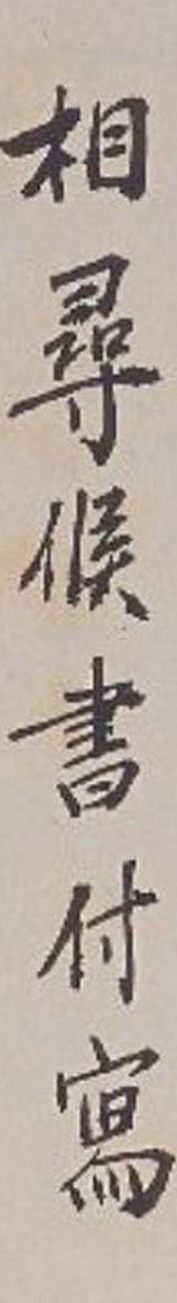相尋候書付写
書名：支那冊封使来琉諸記 下巻
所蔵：University of the Ryukyus Library
